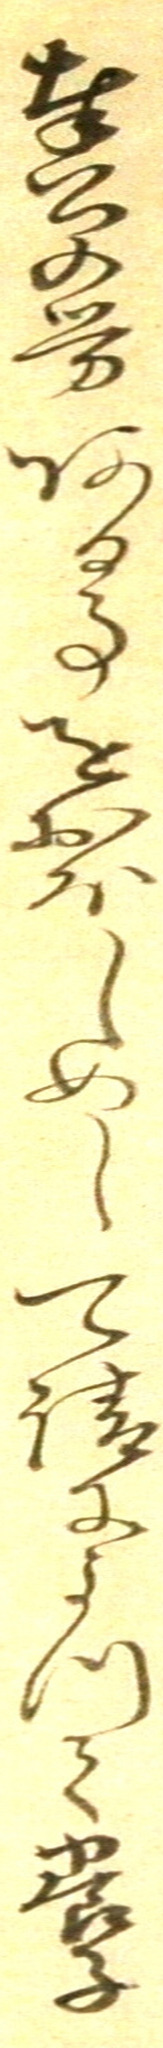奉公の労ある事をおほしめして請によつて養子
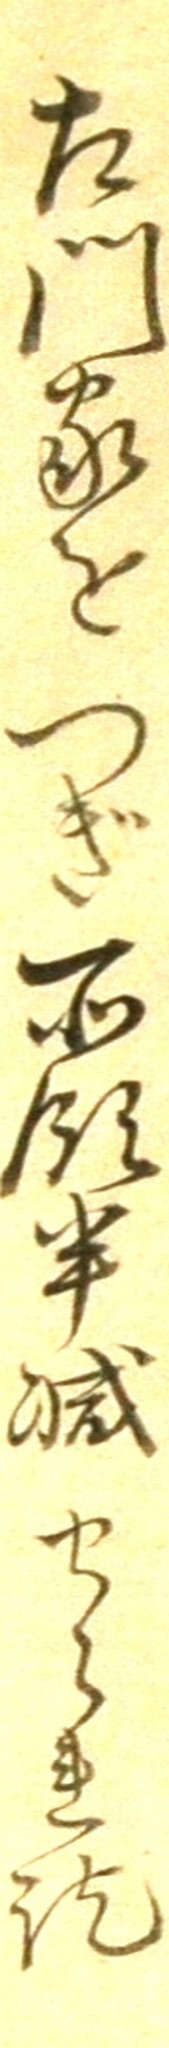左門家をつぎ所領半減せられ訖

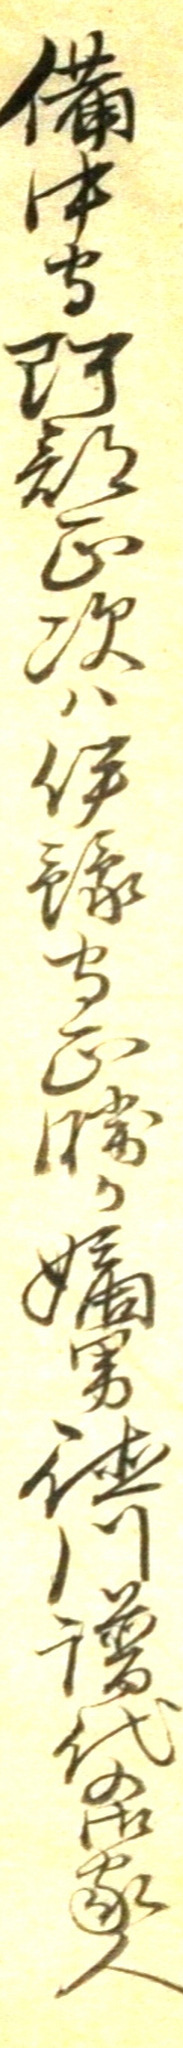備中守阿部正次は伊予守正勝か嫡男徳川殿譜代の御家人
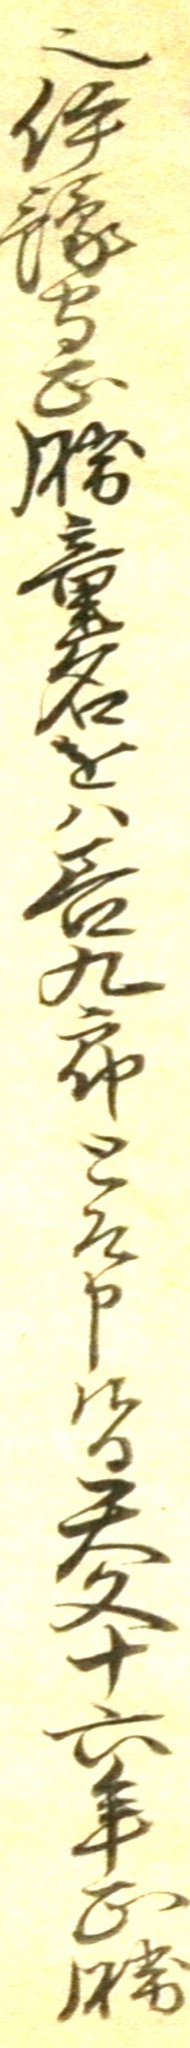也伊予守正勝童名をは善九郎とそ申ける天文十六年正勝
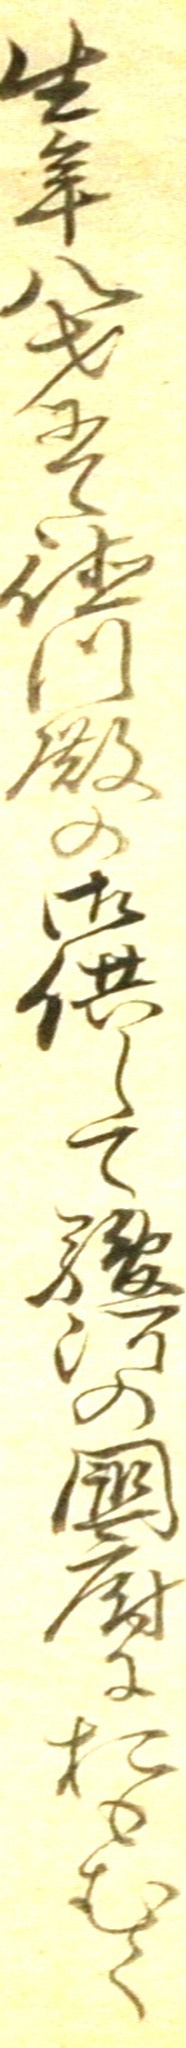生年八才にて徳川殿の御供して駿河の国府におもむく
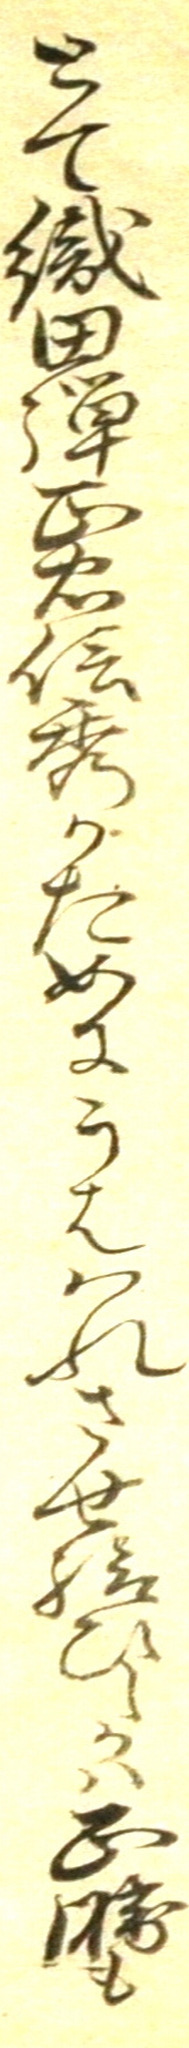とて織田弾正忠信秀かためにうははれさせ給ひしかは正勝も
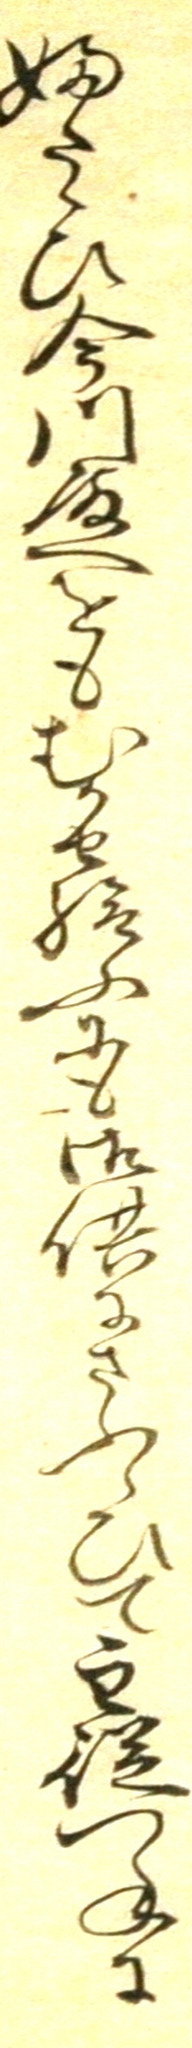ふたゝひ今川殿へをもむかせ給ふにも御供にさふらひて主従つねに
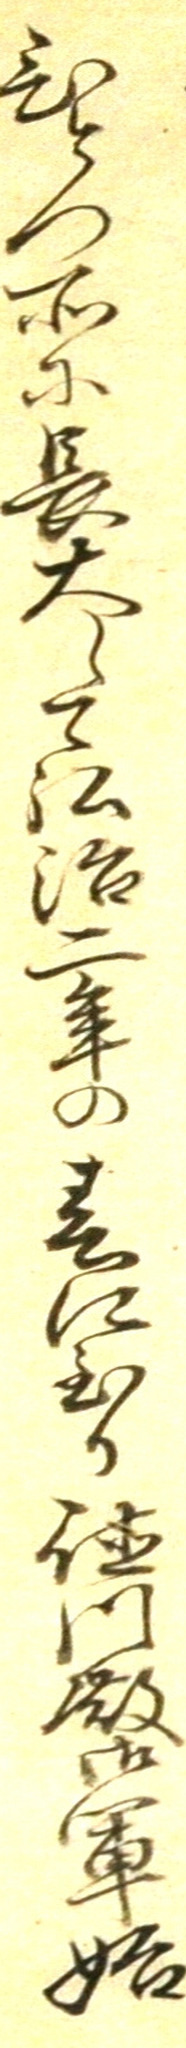ひとつ所に長大して弘治二年の春に至り徳川殿御軍始
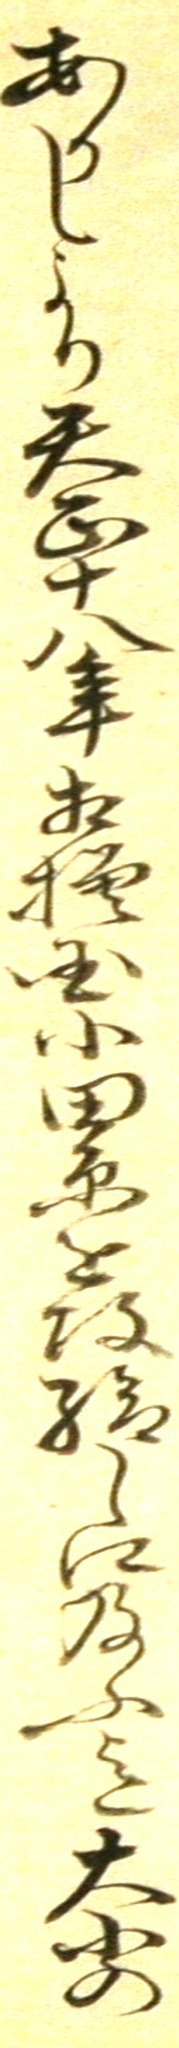ありしより天正十八年相模国小田原を攻給しに及ふ迄大小の
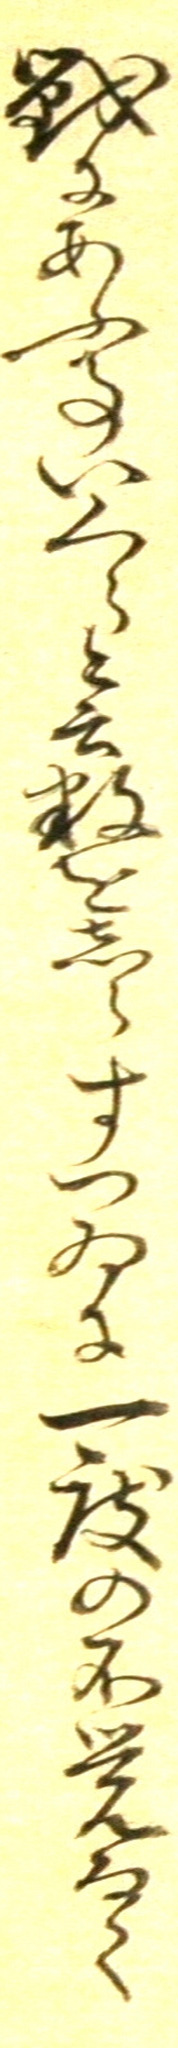戦にあふ事いくらと云数をしらすつゐに一度の不覚なく

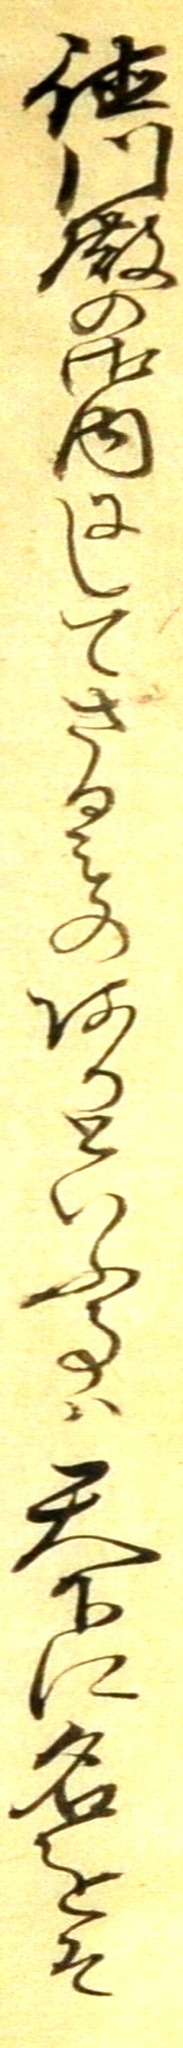徳川殿の御内にしてさるものありといふ事は天下に名をそ
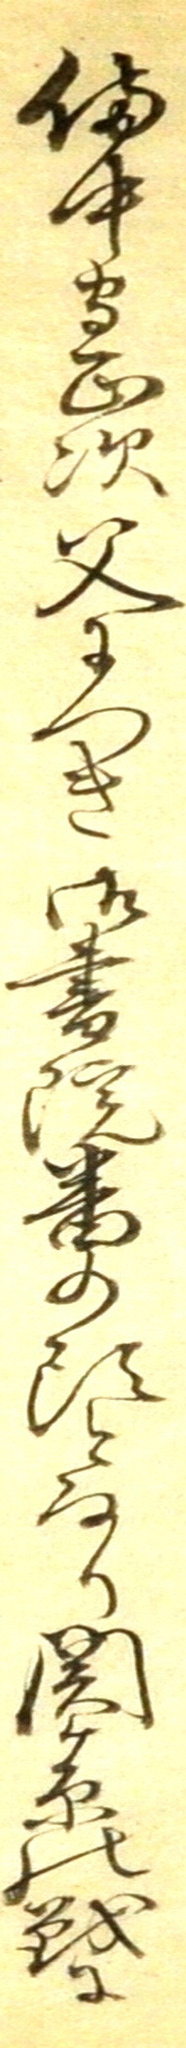備中守正次父につき御書院番の頭となり関ヶ原の戦に
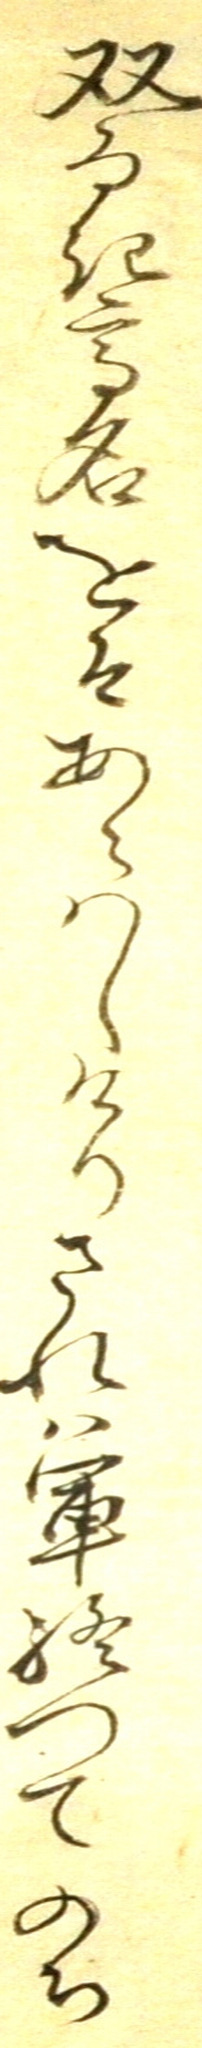双なき高名をそあらはしけりされは軍終つてのち
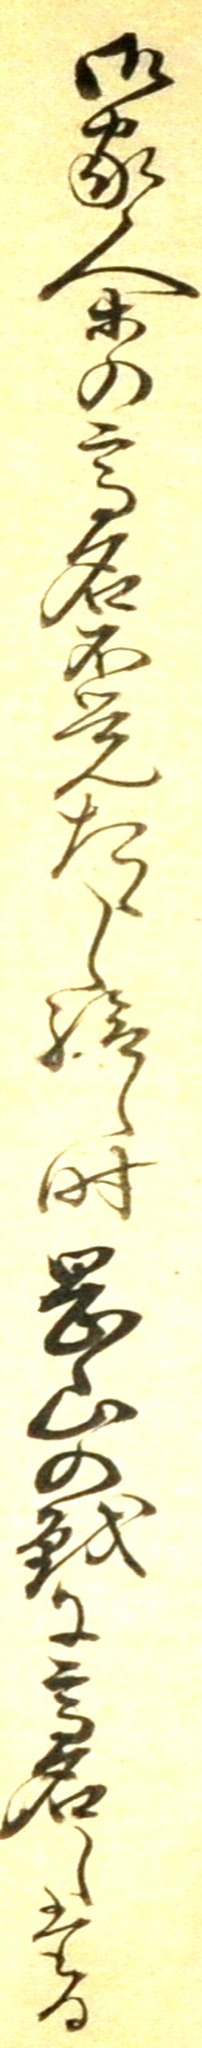御家人等の高名不覚たゝし給し時岡山の戦に高名したる
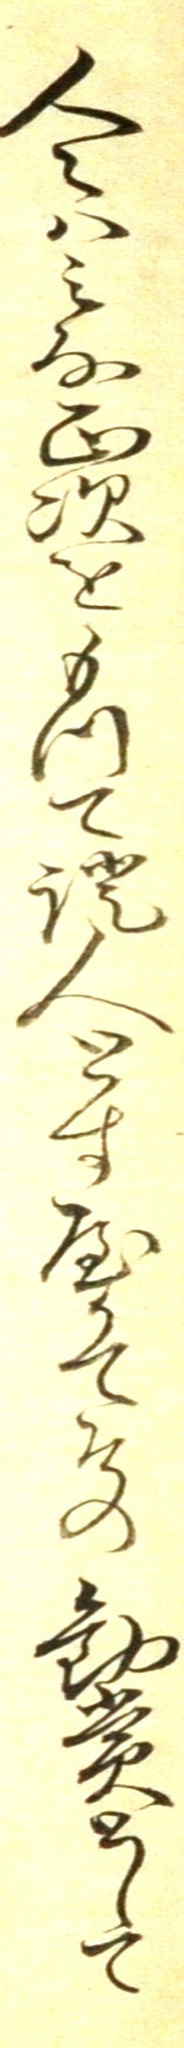人々はみな正次をもつて証人とすやかてその勧賞として
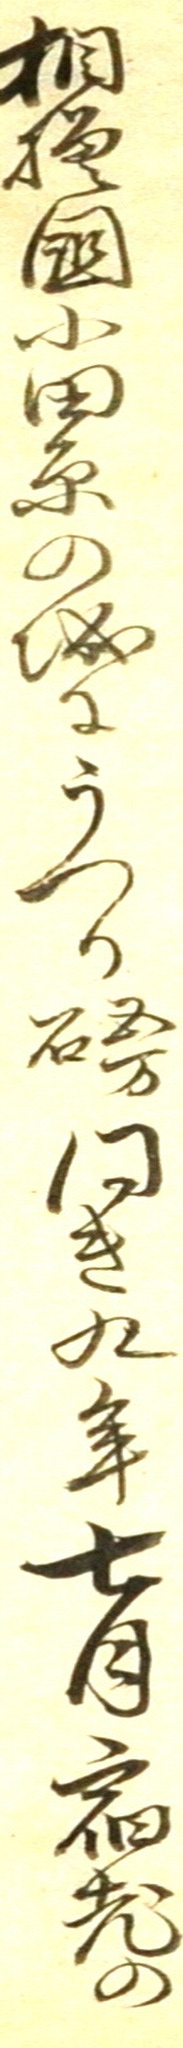相模国小田原の城にうつり五万石同き九年七月宿老の
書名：藩翰譜（五）
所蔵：伊那市立高遠町図書館・合同会社AMANE
